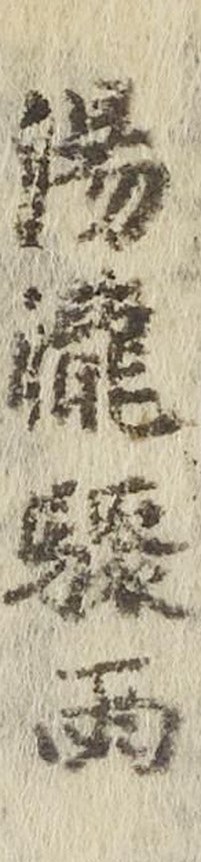湯滝驟雨
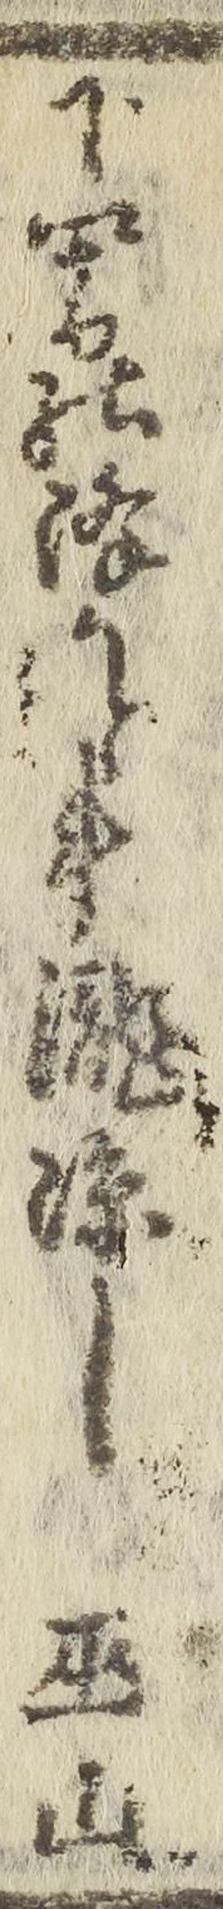下響の降かと計滝涼し巫山
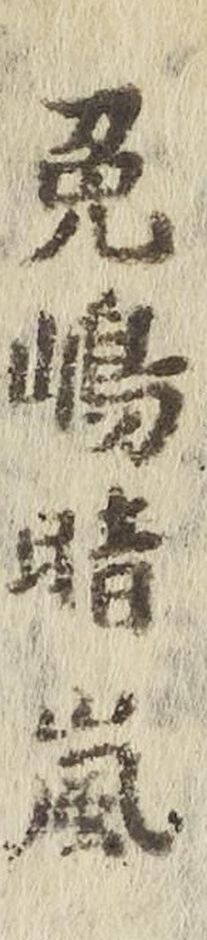兎嶋晴嵐
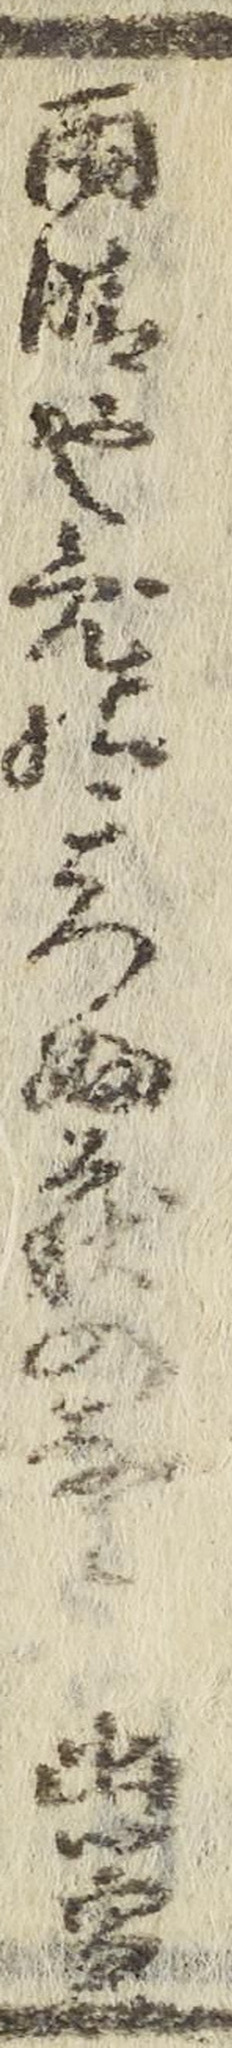雨晴や兎のころふ萩のなみ幽菅
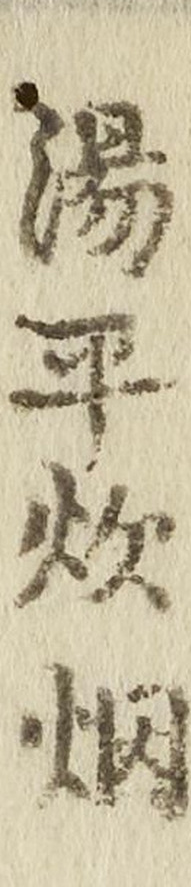湯平炊烟
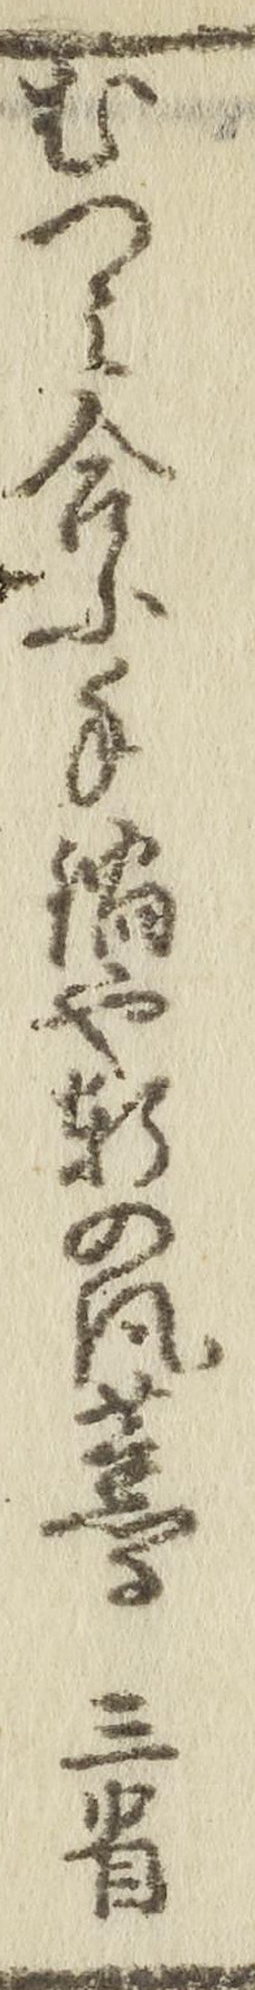むつみ合ふ手鍋や軒の風薫る三省
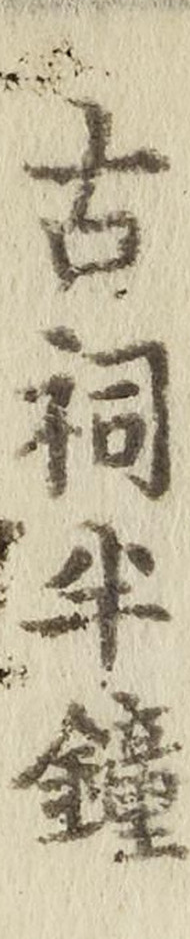古祠半鐘
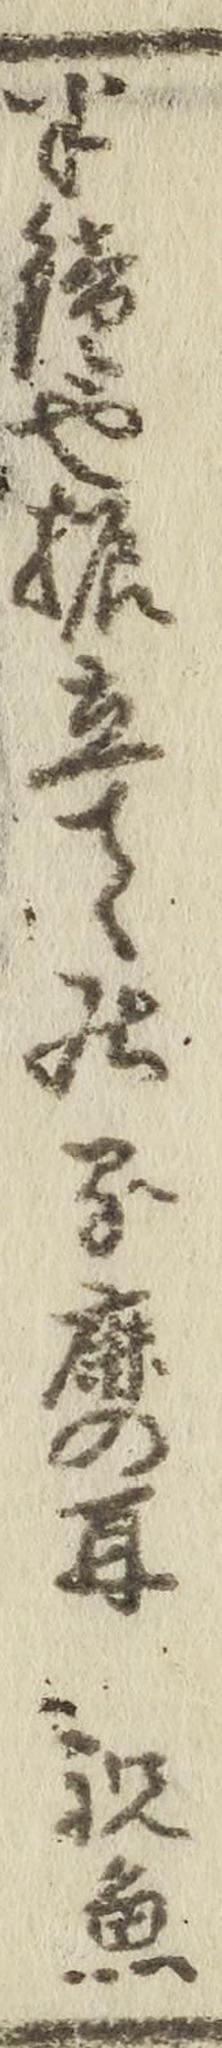半鐘や振立ことのる鹿の耳祝魚
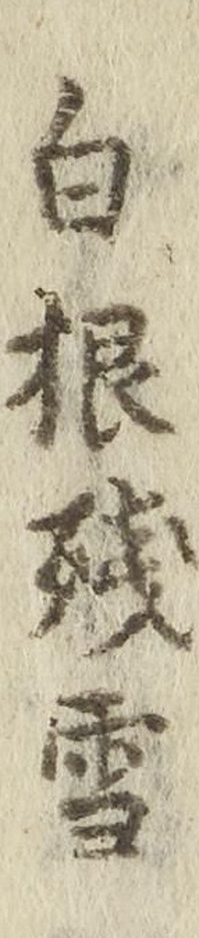白根残雪
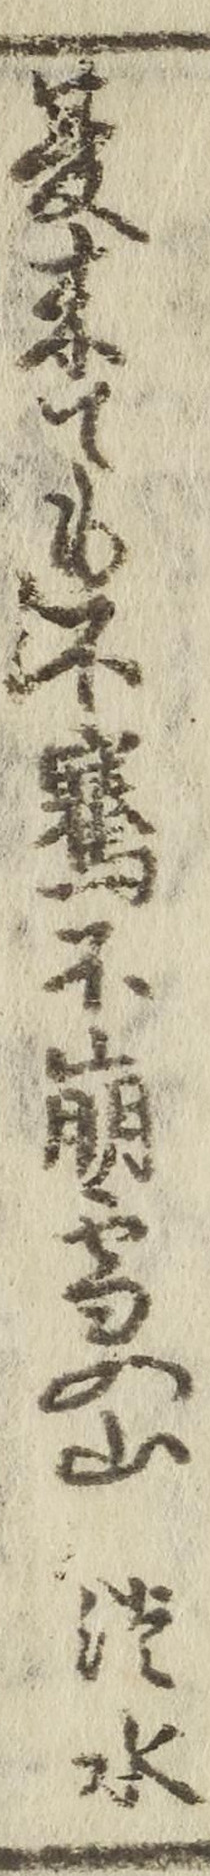夏来ても不騫不崩雪の山淡水
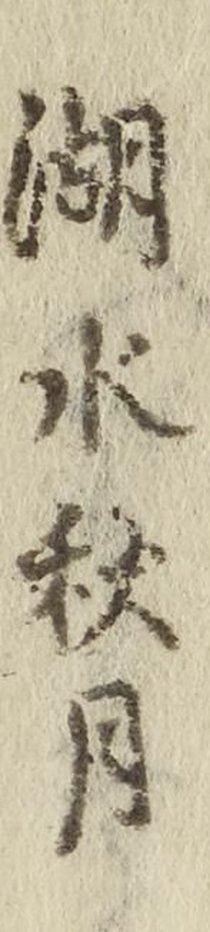湖水秋月
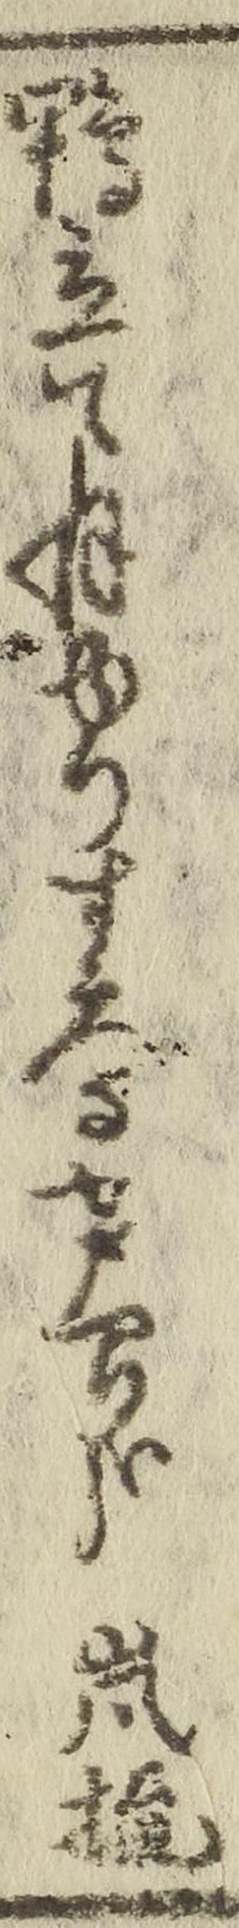鴨立て羽ゆりすえる芦間哉嵐旈？

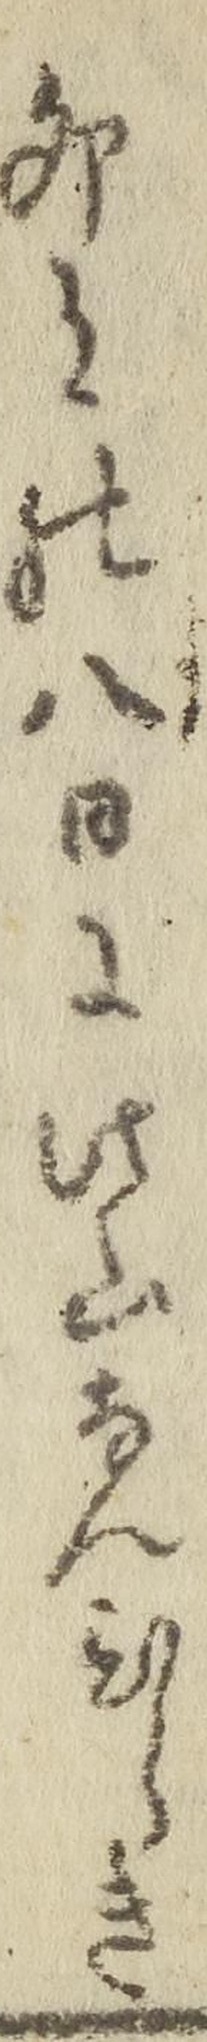卯月の八日に此山なんひらき
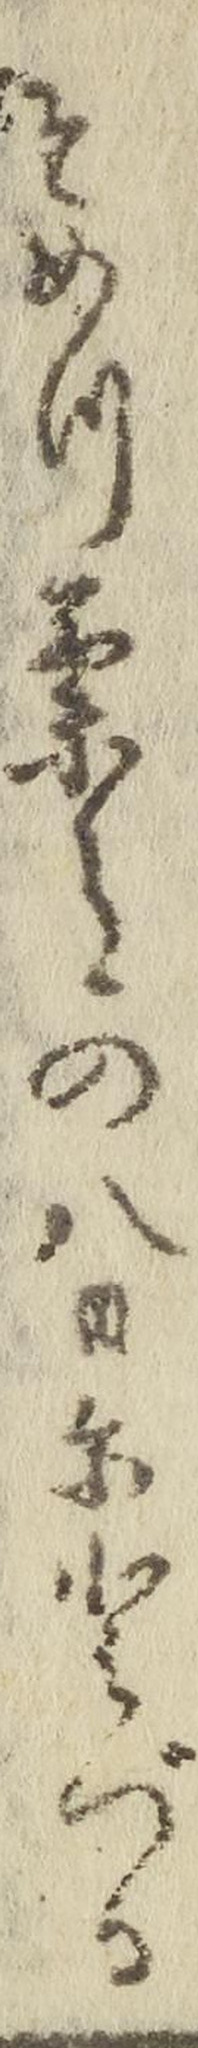そめつ葉月の八日にとづる
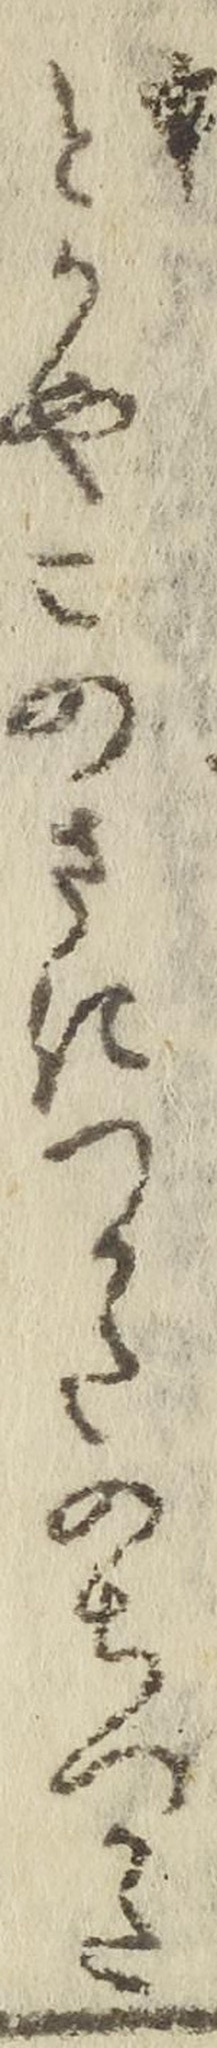とかやこのさきまたのちまた
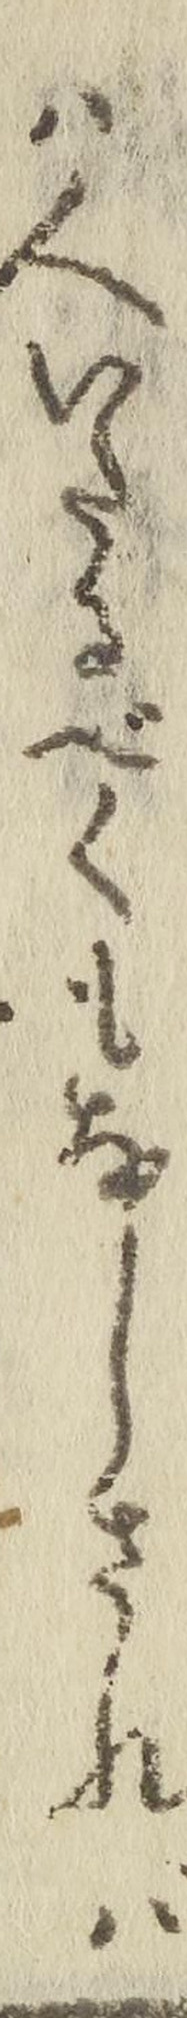は人いたるべくもなしされば
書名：日光山中禅寺　温泉記　全
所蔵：東京大学地震研究所図書室 Earthquake Research Institute Library, The University of Tokyo, JAPAN
